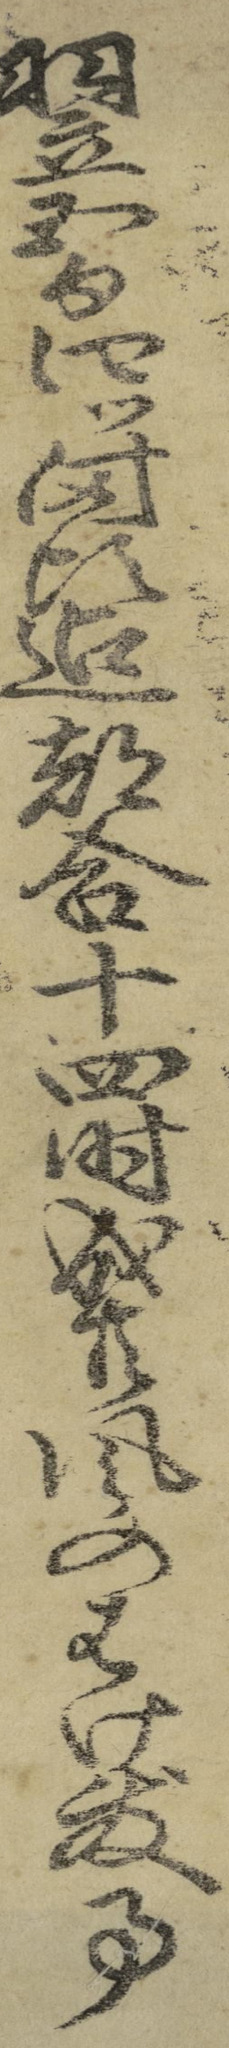翌五日四ツ時頃迄都合十四時成共風のはけ敷事
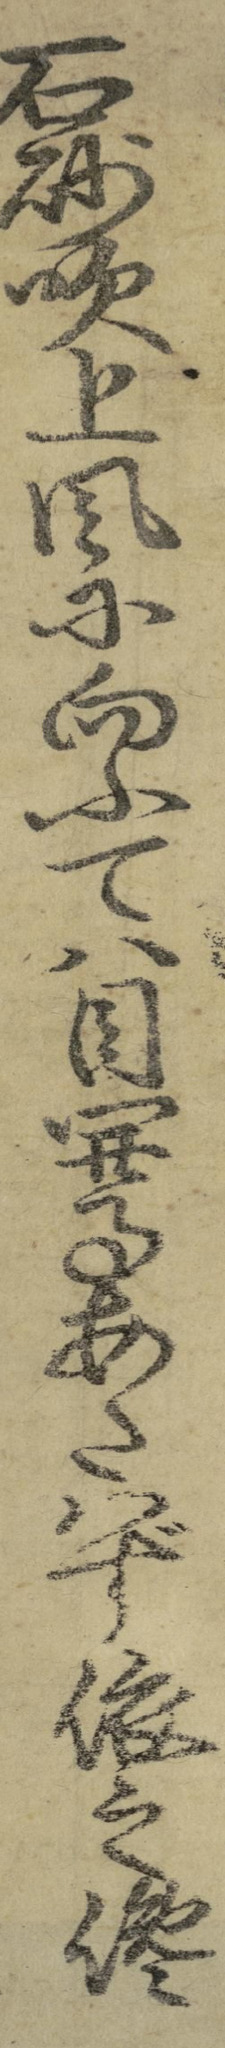石砂吹上風に向ふては目開事あたはず依之儳
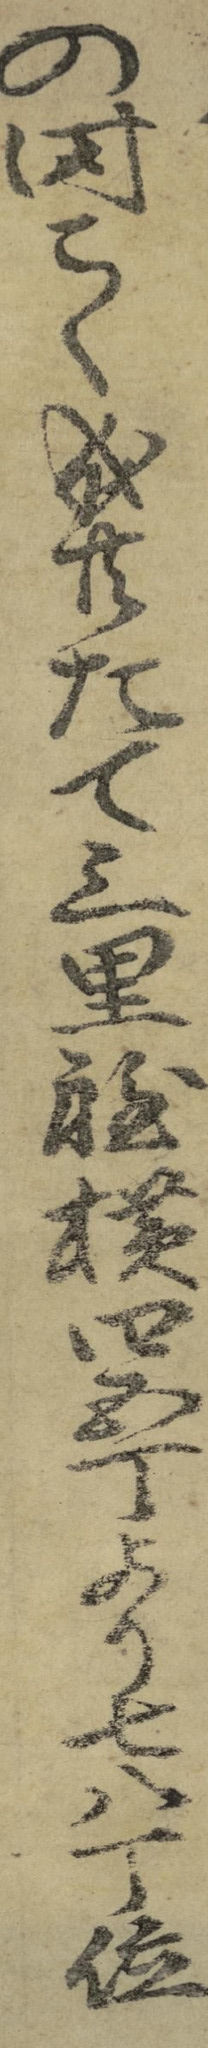の時こく成共たて三里程横四五丁より七八丁位
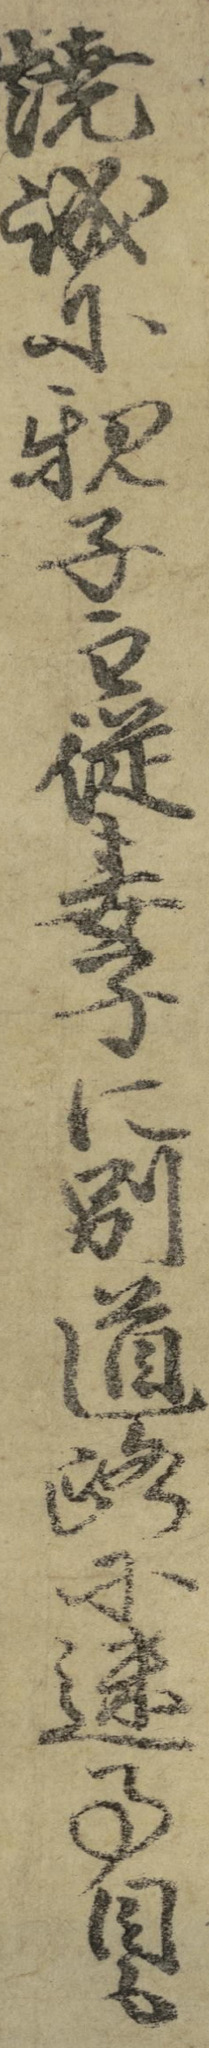焼誠に親子主従妻子に別道路に迷事目も
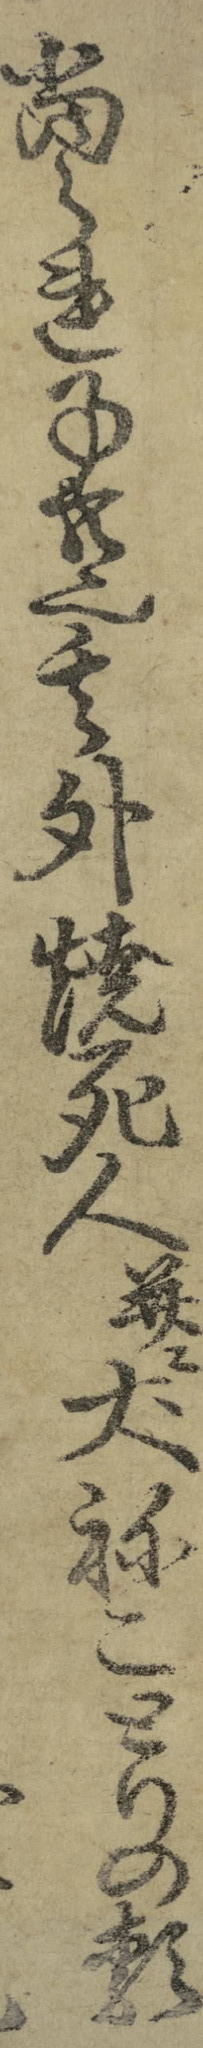当られ事共也其外焼死人幷に犬ねことりの類
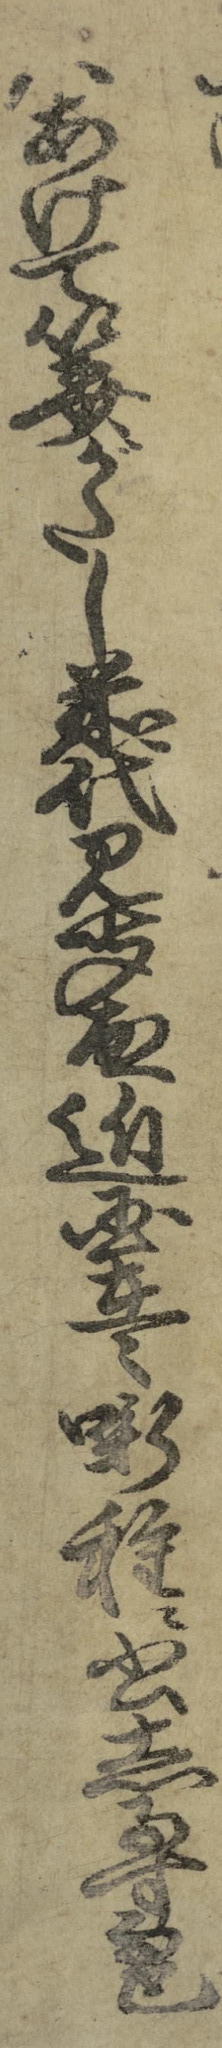はあけて算がたし前代見聞故近国在〻噺種に書しるす而已
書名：出火方角場所附
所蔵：東京大学地震研究所図書室 Earthquake Research Institute Library, The University of Tokyo, JAPAN
